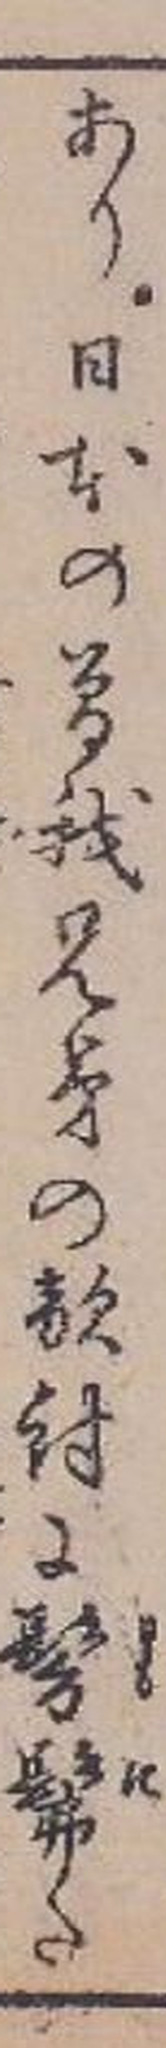あり、日本の曽我兄弟の敵討に髣髴た
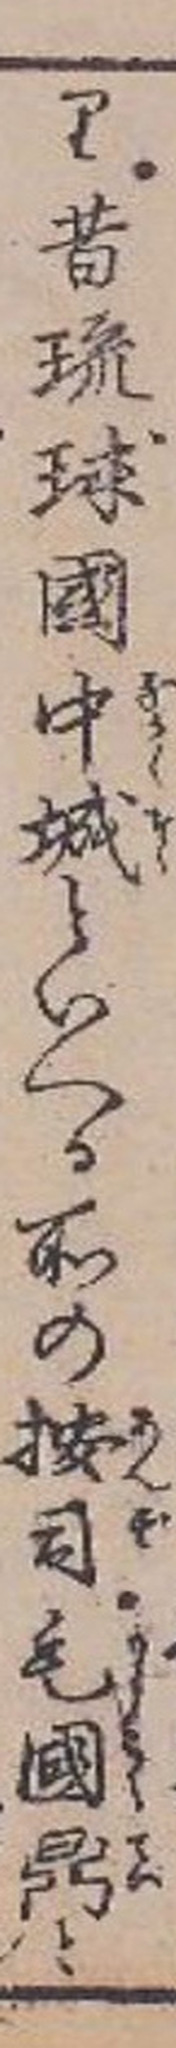り、昔琉球国中城といへる所の按司、毛国鼎と
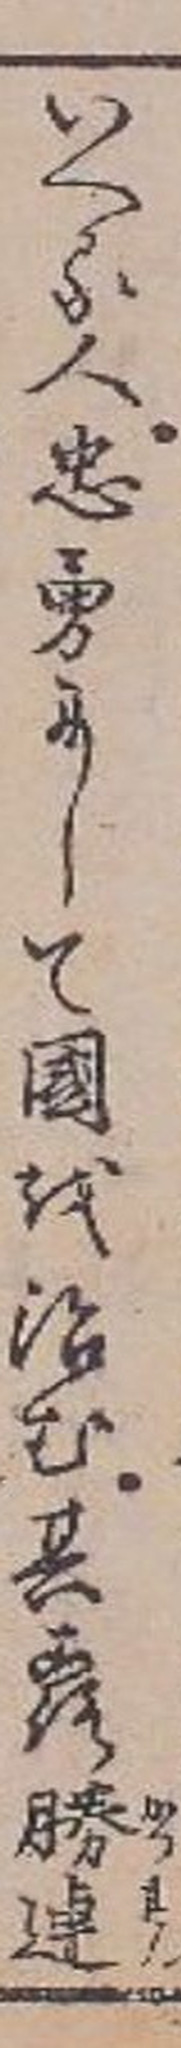いへる人、忠勇にして国を治む、其ころ勝連
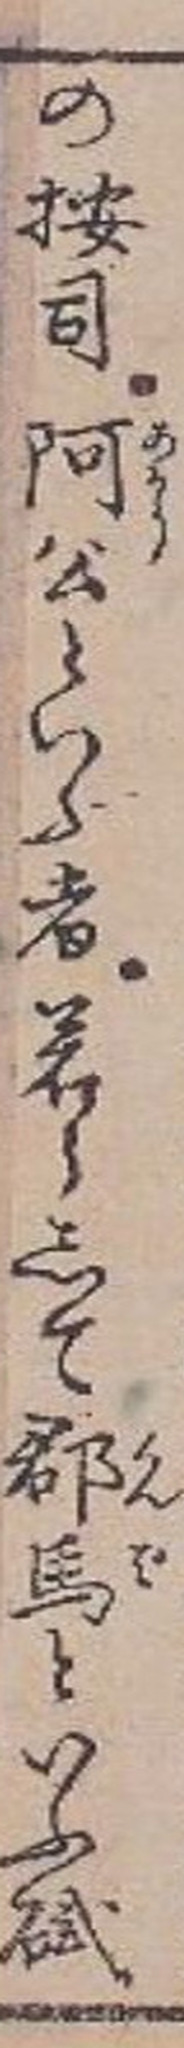の按司、阿公といふ者、若くして郡馬といふ職
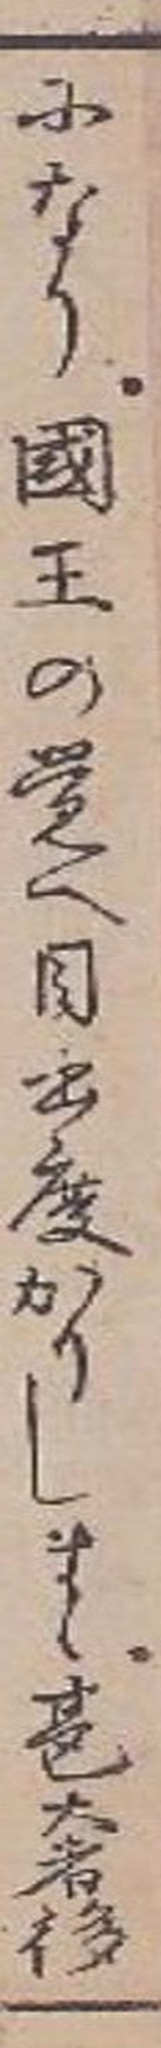になり、国王の覚へ目出度かりしまゝ、甚奢侈
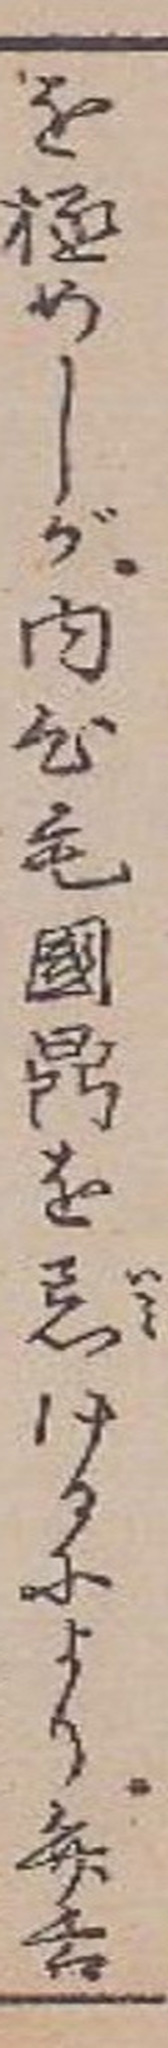を極めしが、内心毛国鼎を忌けるにより、弁舌
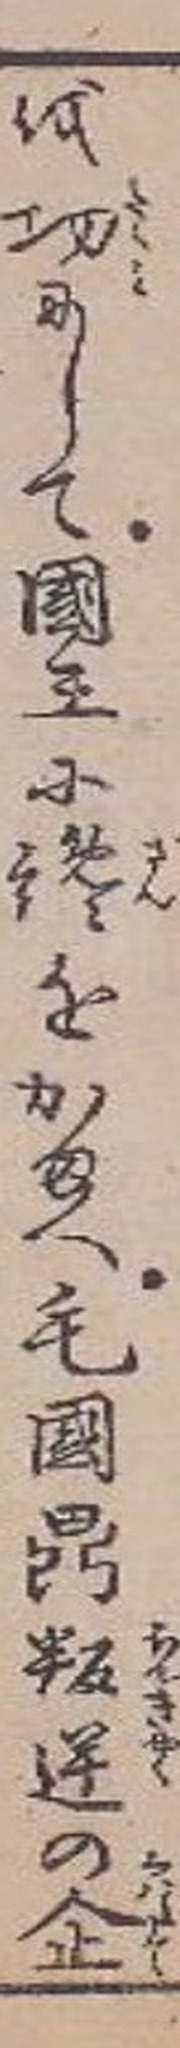を巧にして、国王に讒をかまへ、毛国鼎叛逆の企
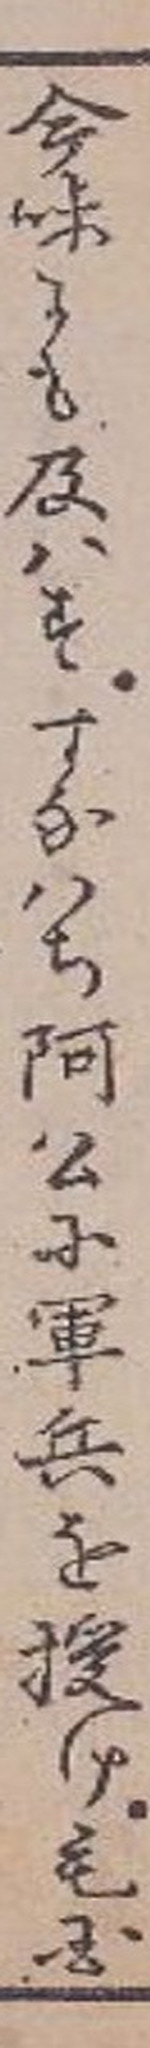今味にも及はす、すなはち阿公に軍兵を授け、毛国
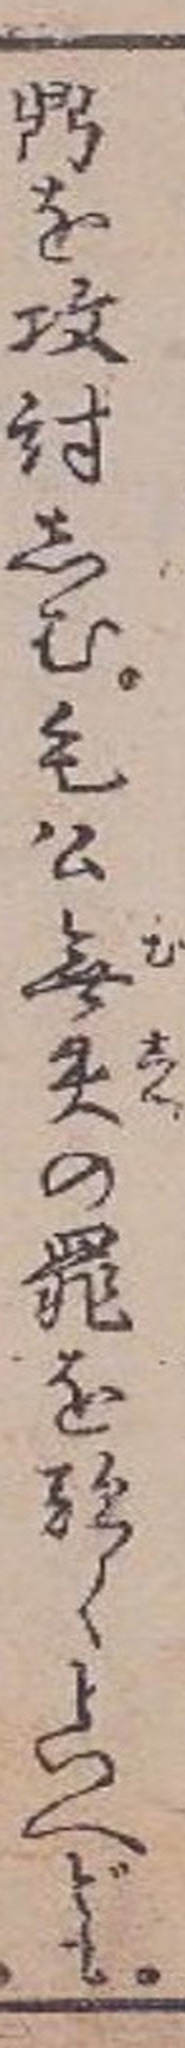鼎を攻討しむ、毛公無失の罪を歎くといへども、
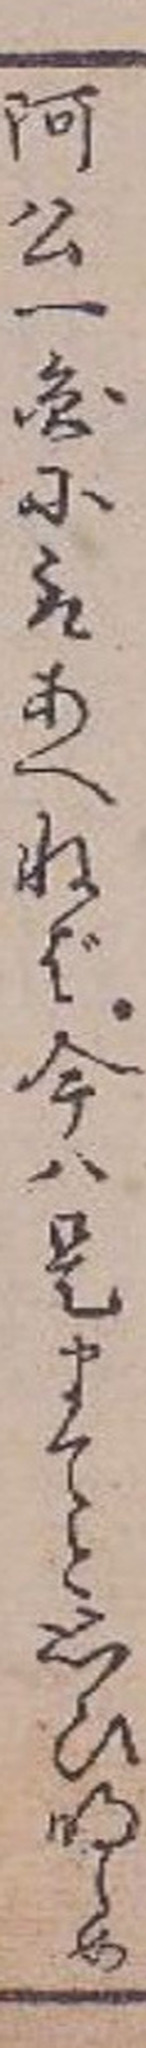阿公一円に取あへねば、今は是まてと思ひ明らめ、
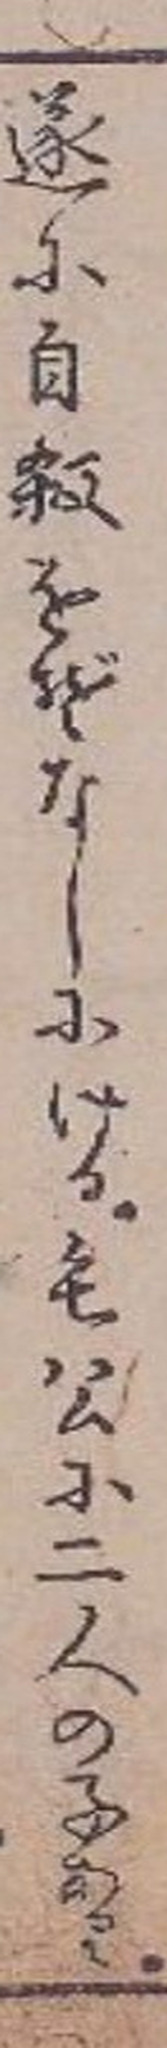遂に自殺をぞなしにける、毛公に二人の子あり、
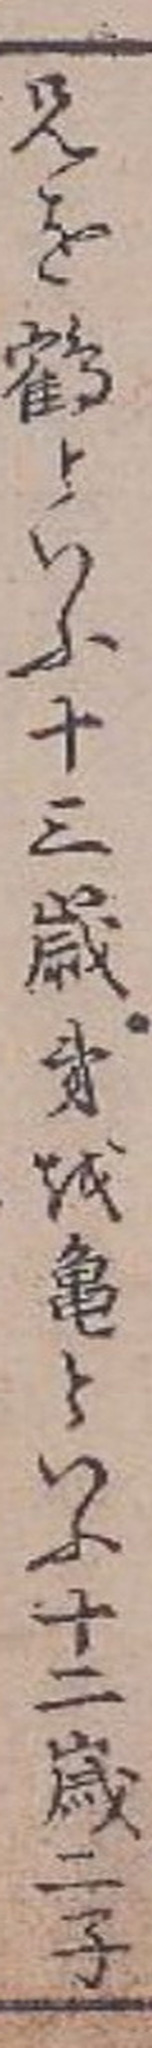兄を鶴といふ十三歳、弟を亀といふ十二歳、二子
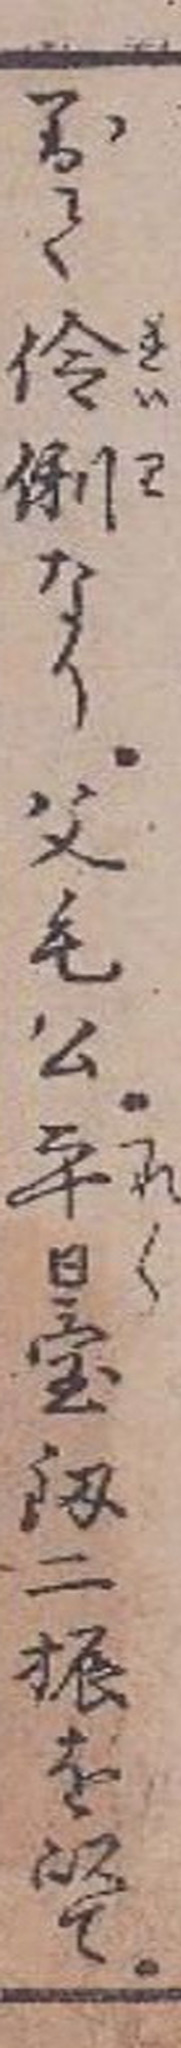到て伶俐なり、父毛公、平日宝釼二振を以て、

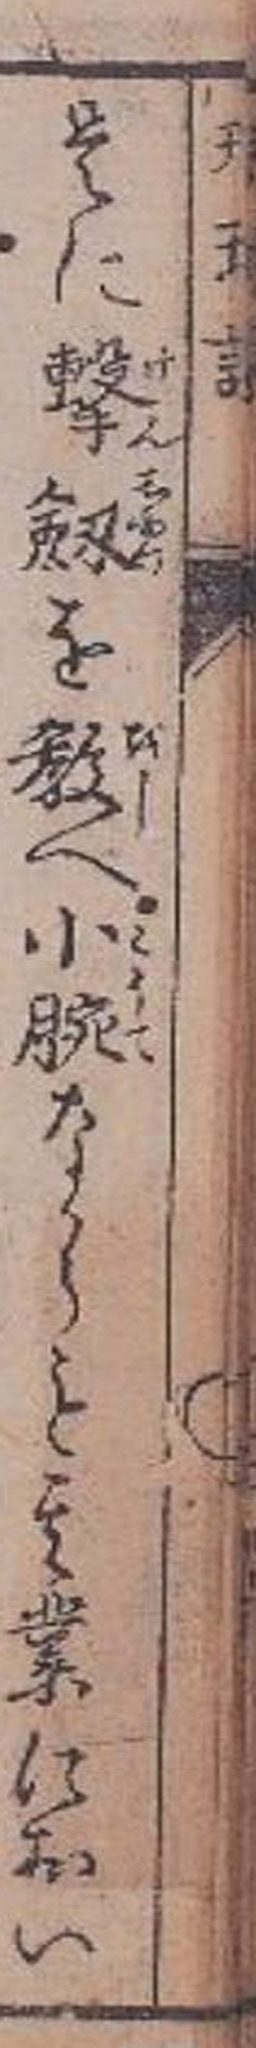是に撃劔を教へ、小腕なからも其業におい
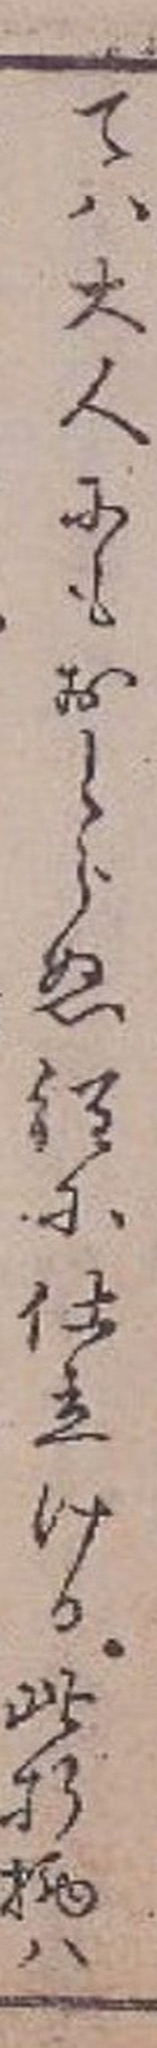ては、大人にもおとらぬ程に仕立ける、此折柄は
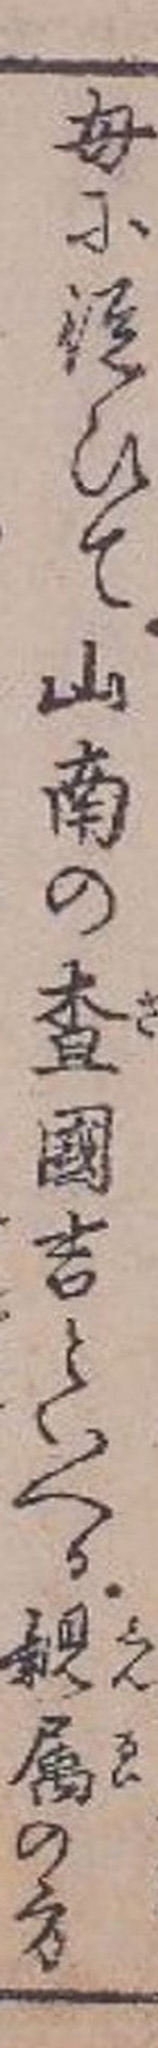母に従ひて、山南の査国吉といへる、親属の方
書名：琉球談
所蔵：University of the Ryukyus Library
